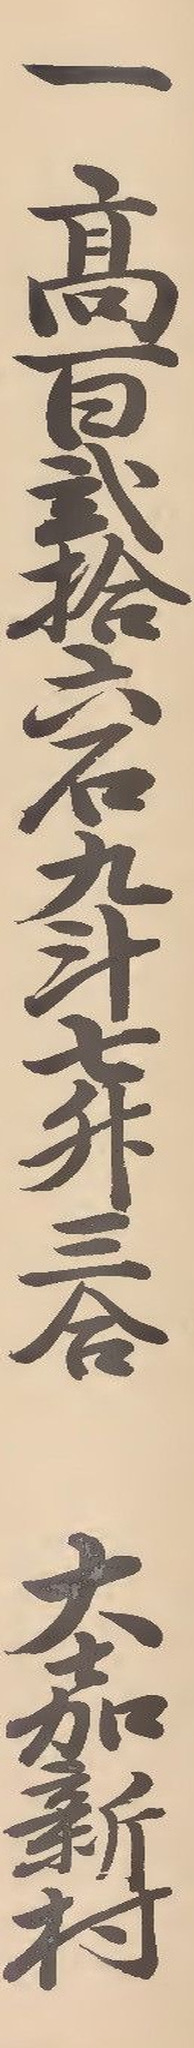一高百弐拾六石九斗七升三合大嘉新村
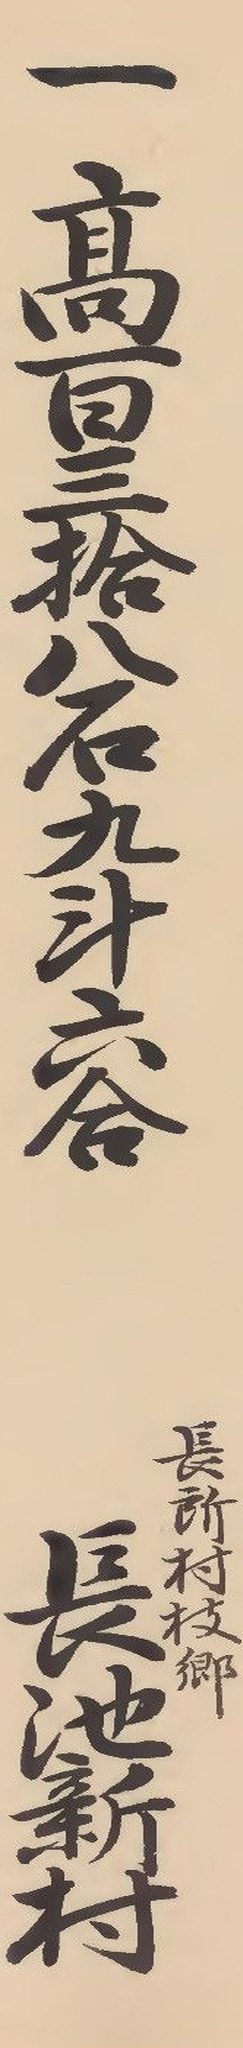一高百三拾八石九斗六合長池新村
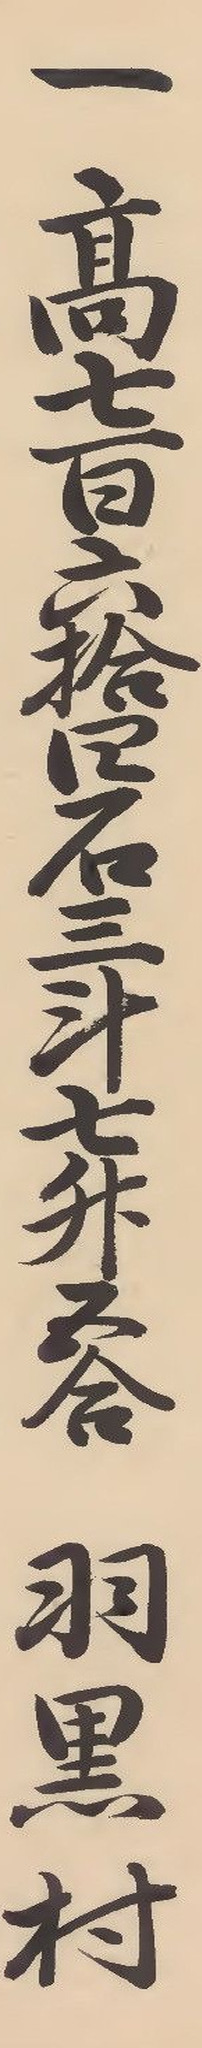一高七百六拾四石三斗七升五合羽黒村
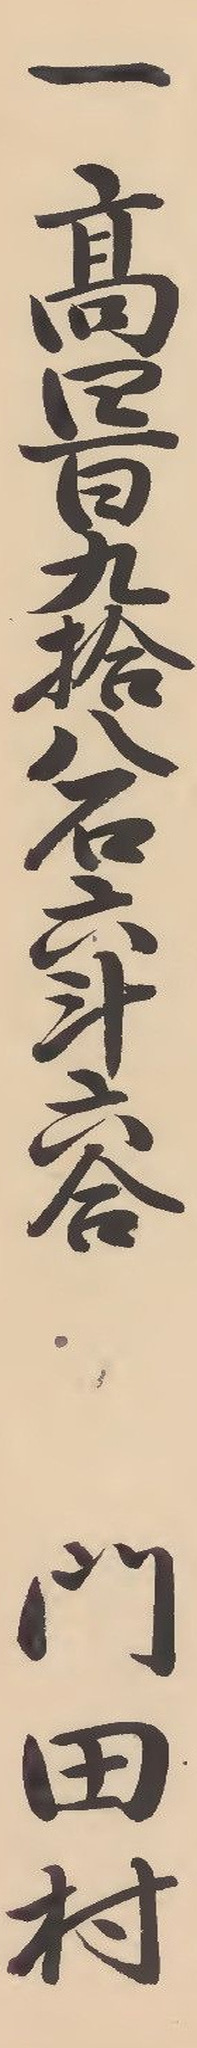一高四百九拾八石六斗六合門田村

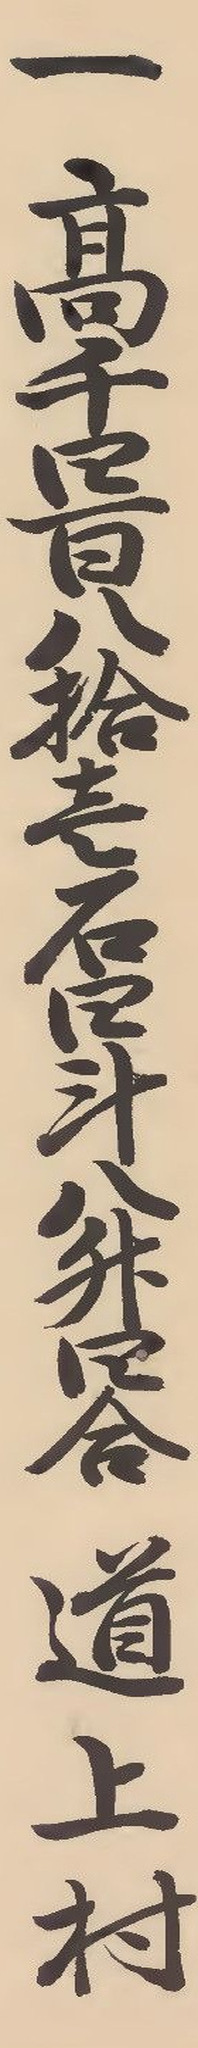一高千四百八拾壱石四斗八升四合道上村
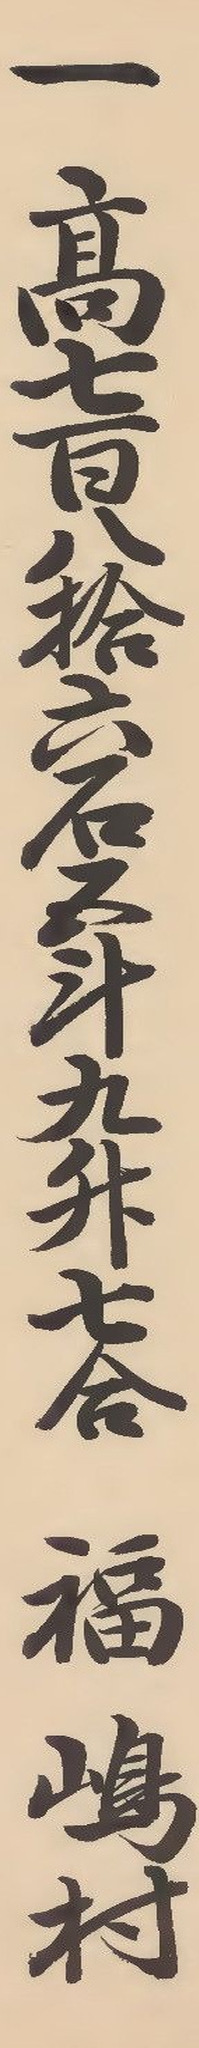一高七百八拾六石五斗九升七合福島村
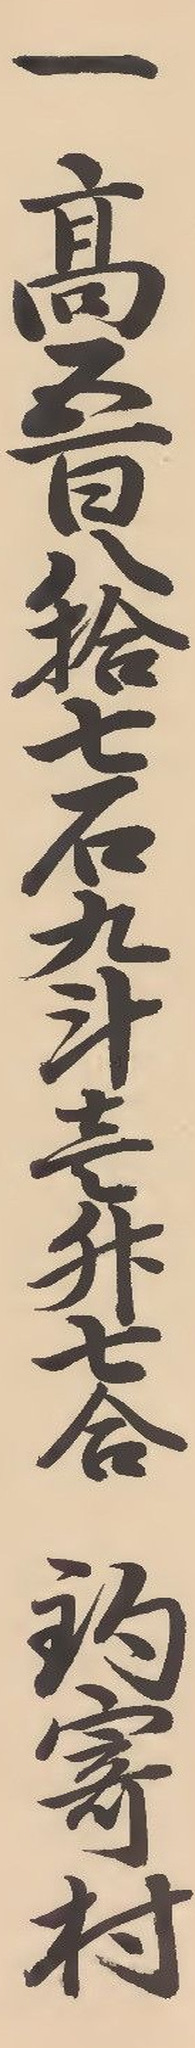一高五百八拾七石九斗壱升七合釣寄村
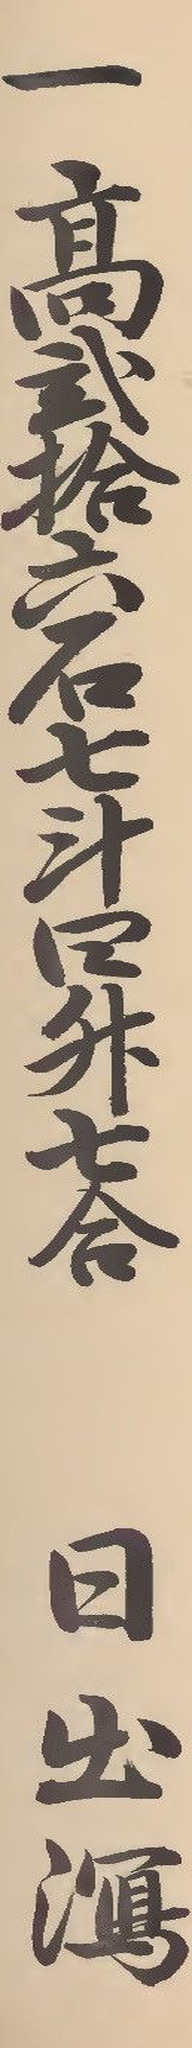一高弐拾六石七斗四升七合日出潟
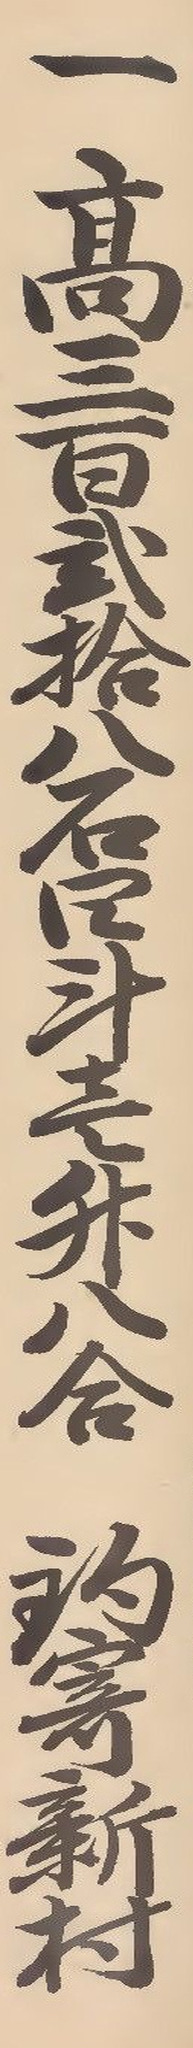一高三百弐拾八石四斗壱升八合釣寄新村
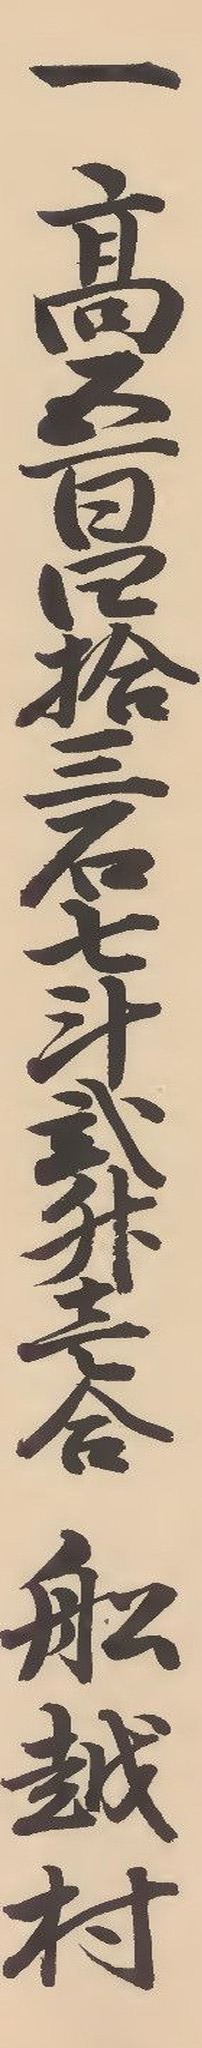一高五百四拾三石七斗弐升壱合船越村
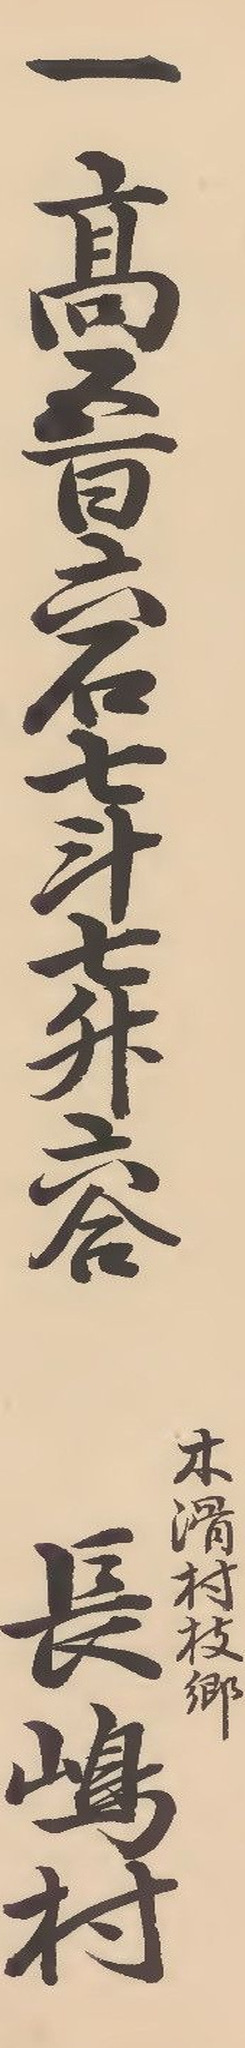一高五百六石七斗七升六合長島村
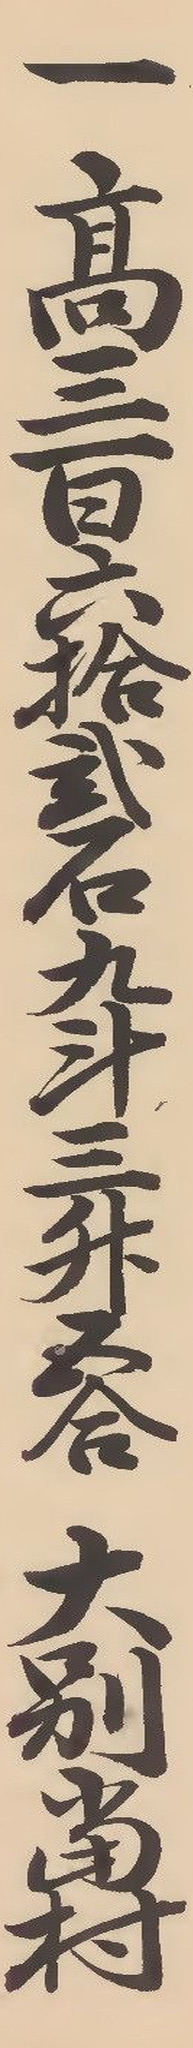一高三百六拾弐石九斗三升五合大別当村

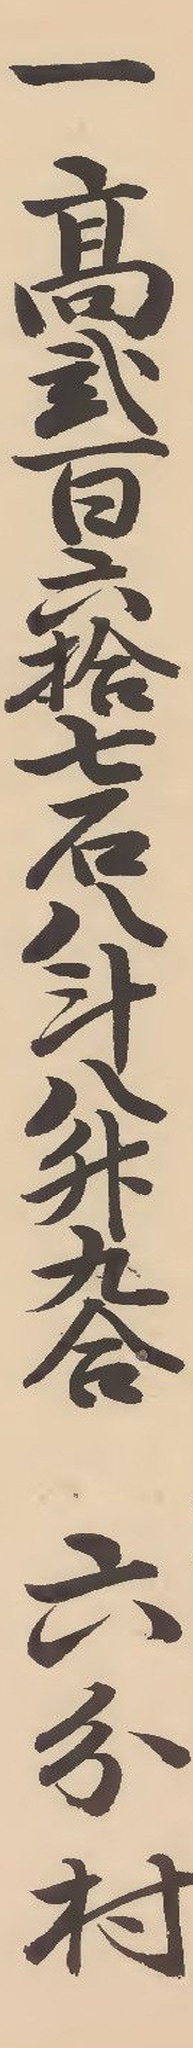一高弐百六拾七石八斗八升九合六分村
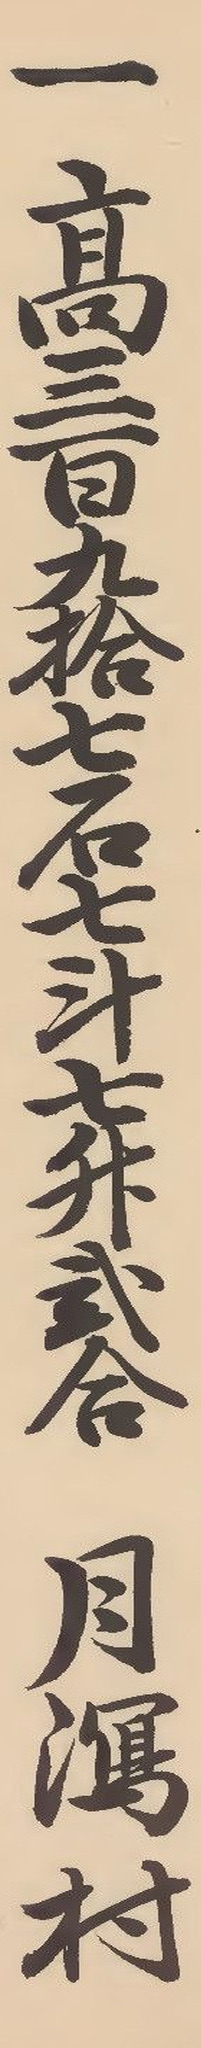一高三百九拾七石七斗七升弐合月潟村
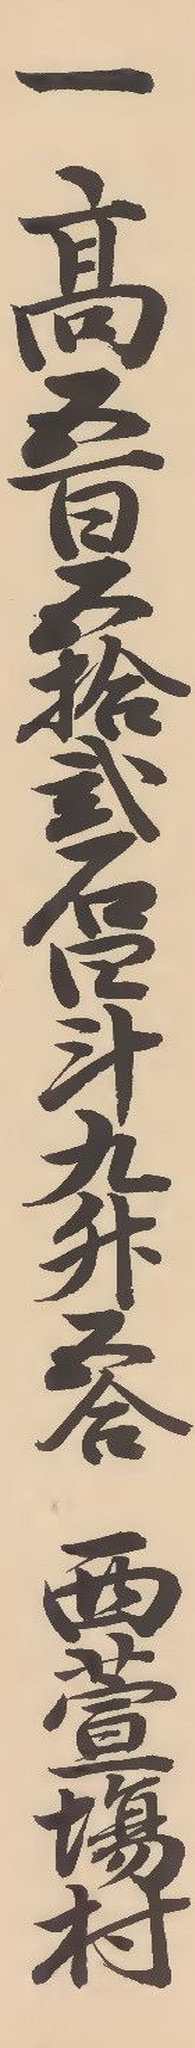一高五百五拾弐石四斗九升五合西萱場村
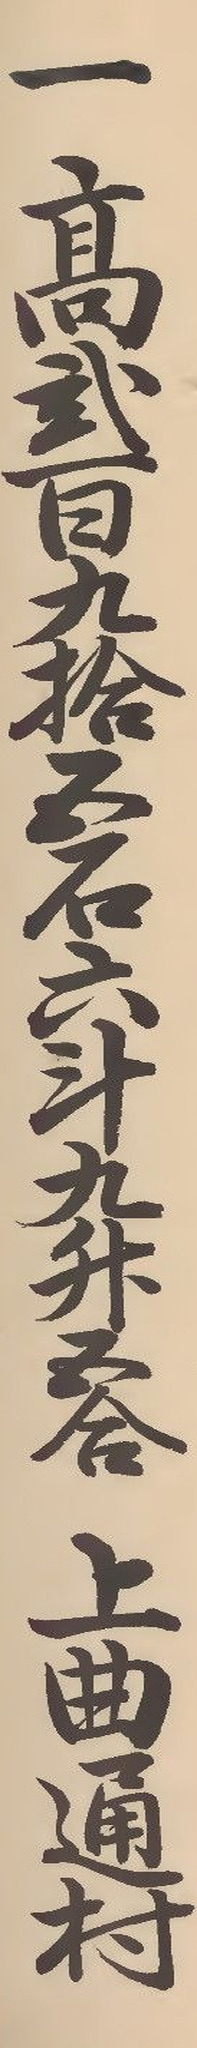一高弐百九拾五石六斗九升五合上曲通村
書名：越後国郷帳　下
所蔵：国立公文書館 National Archives of Japan
